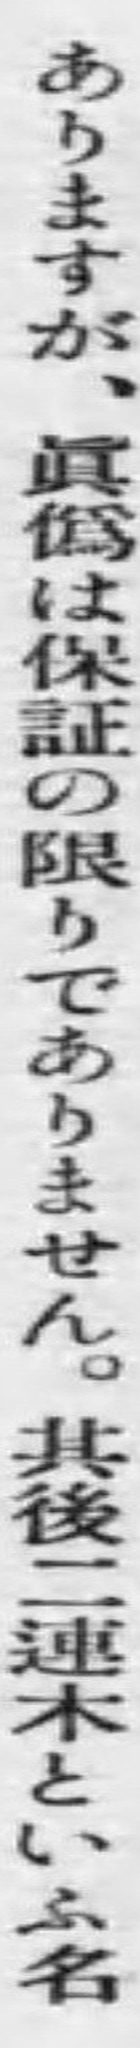ありますが、真偽は保証の限りでありません。其後二連木といふ名
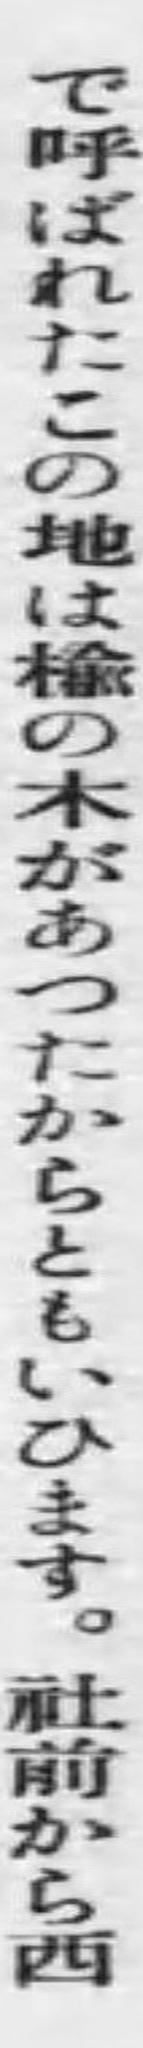で呼ばれたこの地は楡の木があつたからともいひます。社前から西
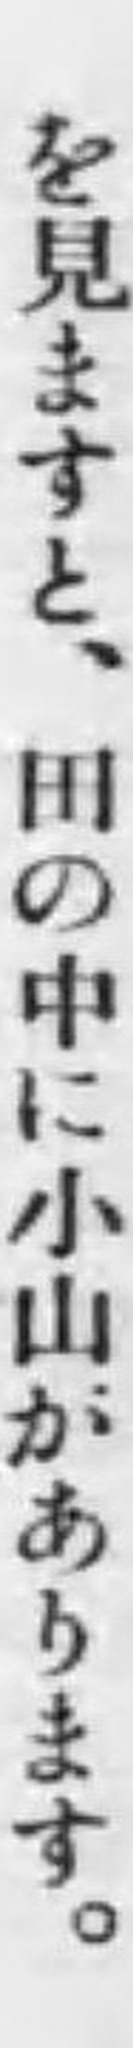を見ますと、田の中に小山があります。
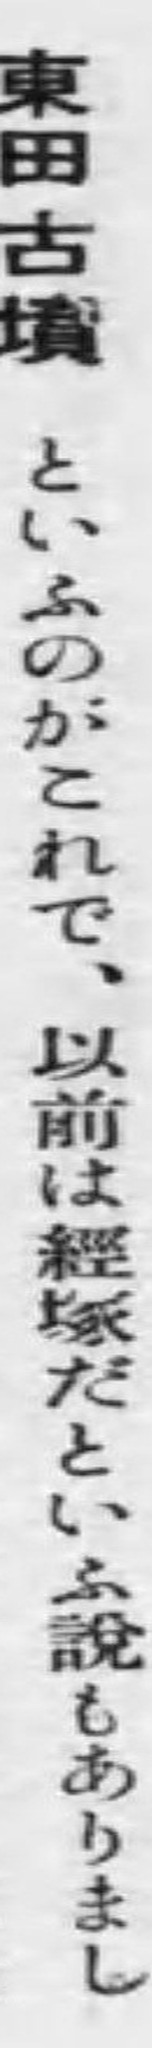東田古墳といふのがこれで、以前は経塚だといふ説もありまし
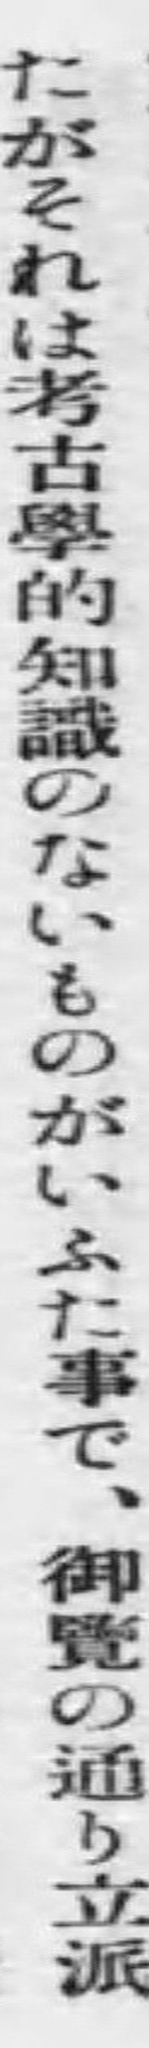たがそれは考古学的知識のないものがいふた事で、御覧の通り立派
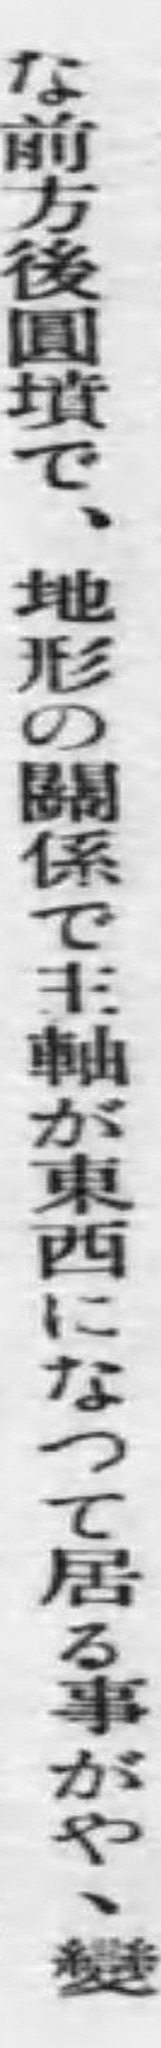な前方後円墳で、地形の関係で主軸が東西になつて居る事がやゝ変
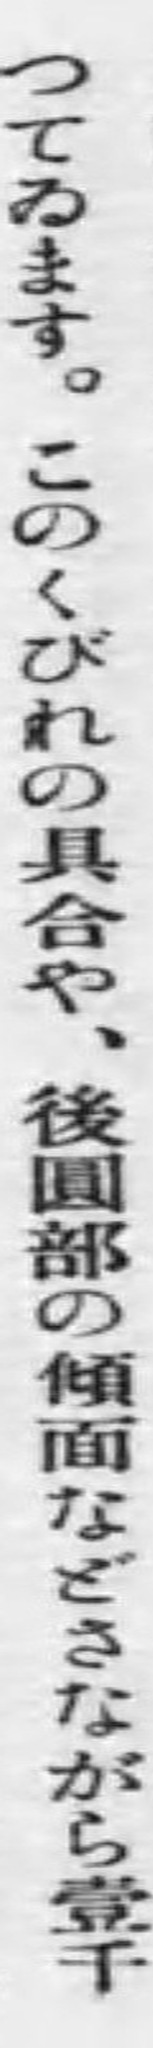つてゐます。このくびれの具合や、後円部の傾面などさながら壱千
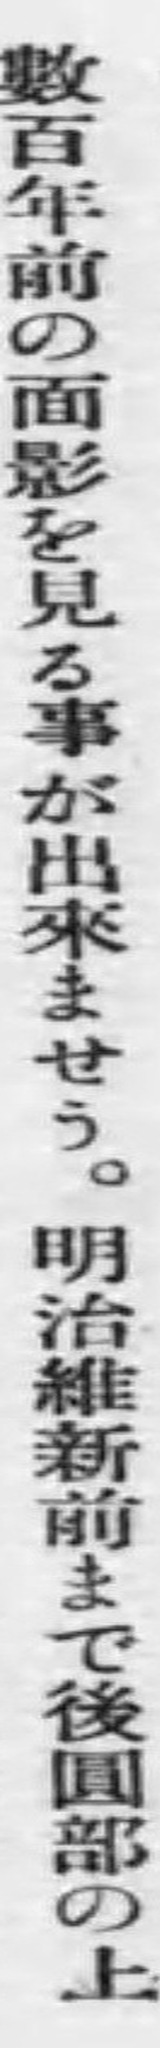数百年前の面影を見る事が出来ませう。明治維新前まで後円部の上
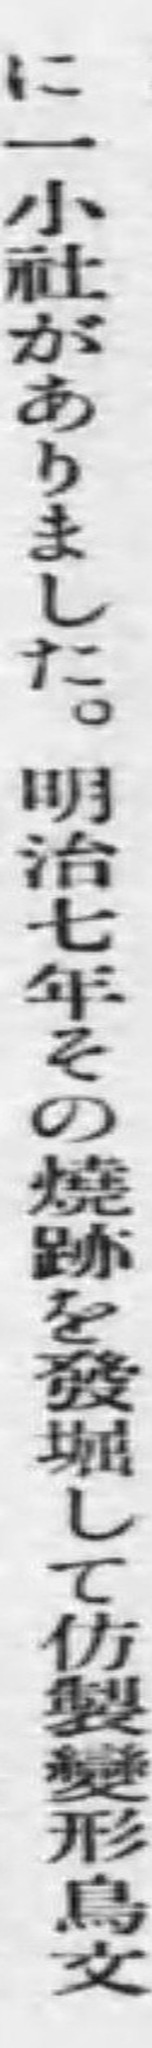に一小社がありました。明治七年その焼跡を発堀して仿製変形鳥文
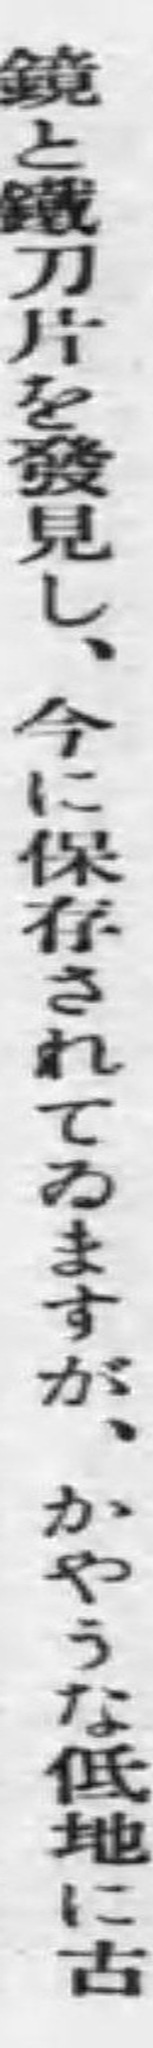鏡と鉄刀片を発見し、今に保存されてゐますが、かやうな低地に古
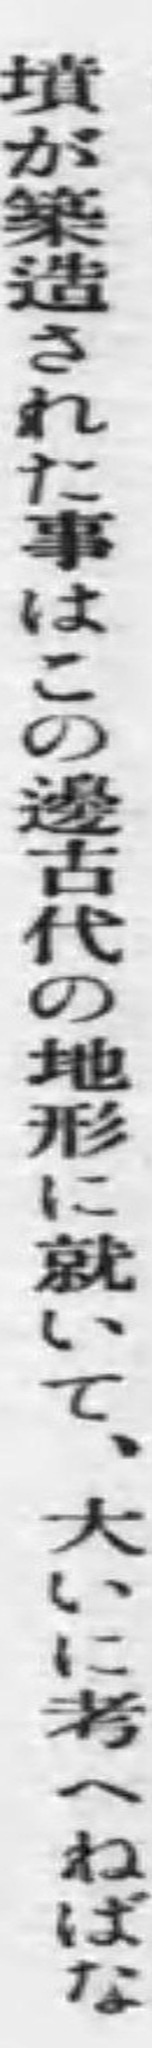墳が築造された事はこの辺古代の地形に就いて、大いに考へねばな
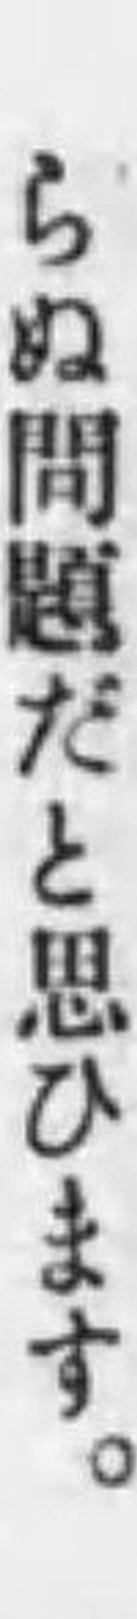らぬ問題だと思ひます。
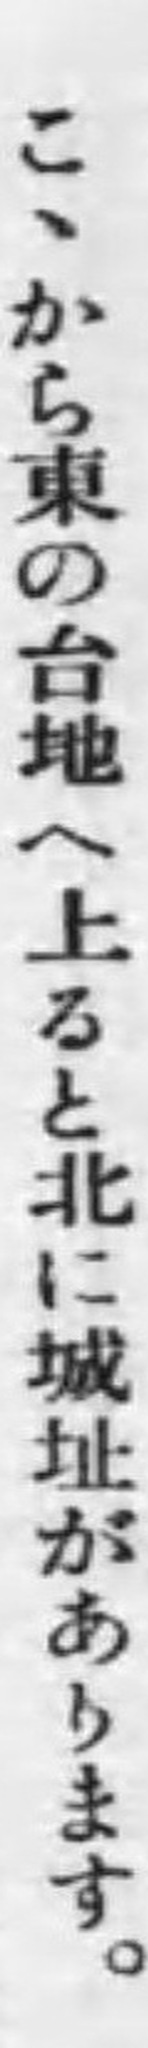こゝから東の台地へ上ると北に城址があります。
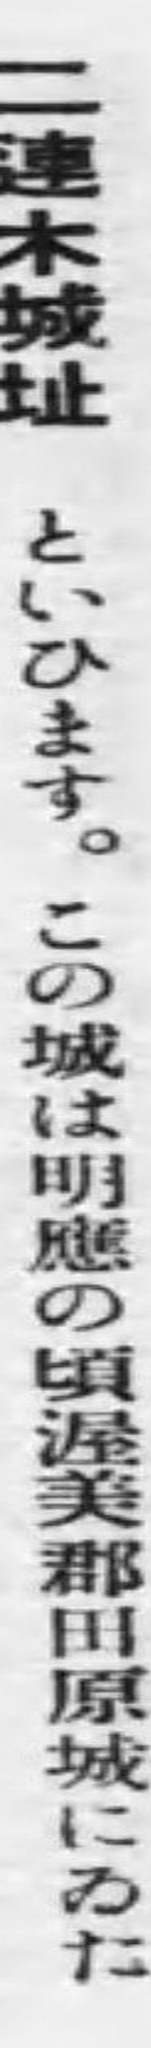二連木城址といひます。この城は明応の頃渥美郡田原城にゐた
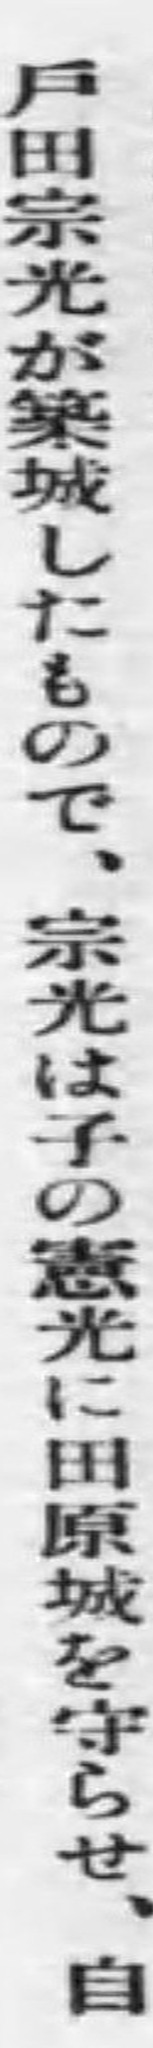戸田宗光が築城したもので、宗光は子の憲光に田原城を守らせ、自

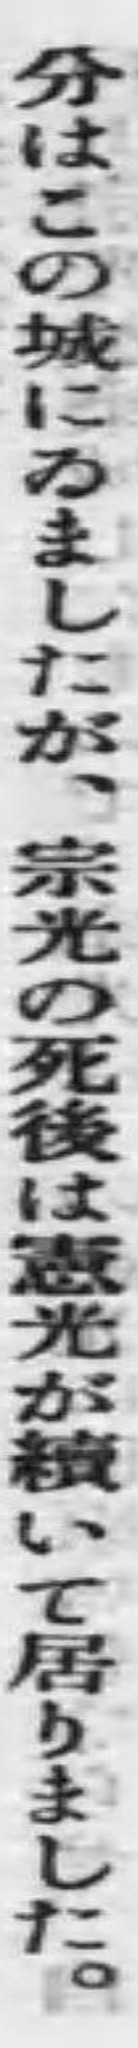分はこの城にゐましたが、宗光の死後は憲光が続いて居りました。
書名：東三河道中記 : 豊橋市及其附近案内
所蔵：国立国会図書館 National Diet Library, JAPAN
